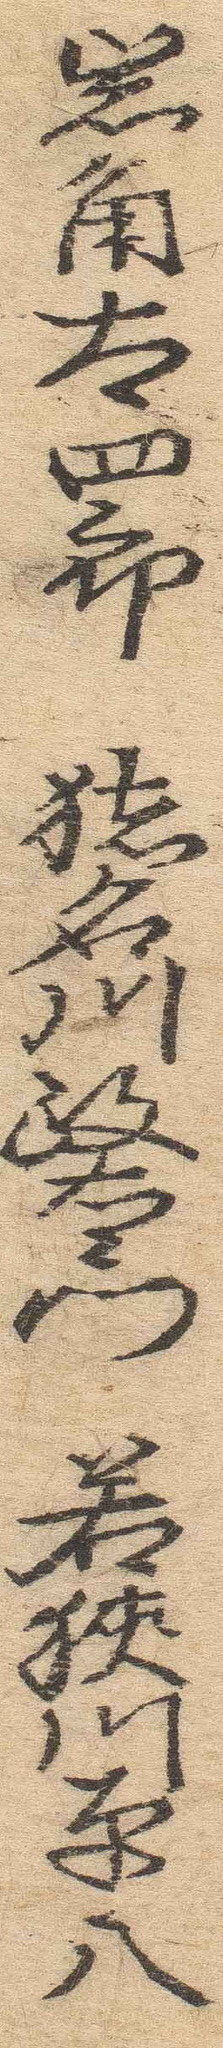岩角太四郎猪名川政右衛門若狭川平八
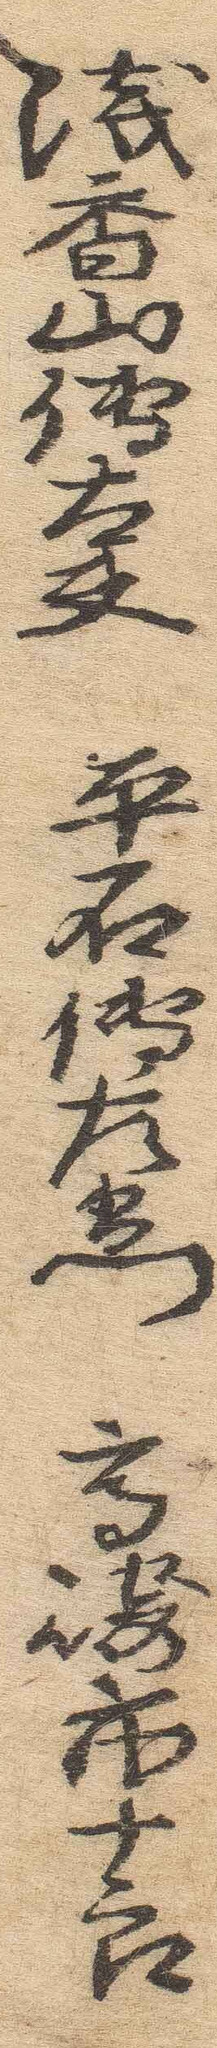浅香山伝太夫平石伝左衛門高崎市丈十郎
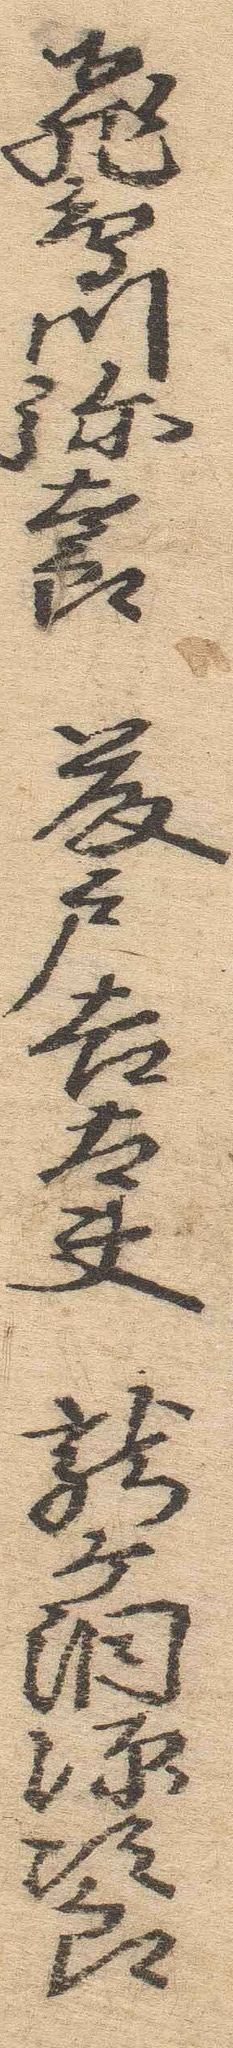飛鳥川弥太郎藤戸吉太夫龍ケ洞源次郎
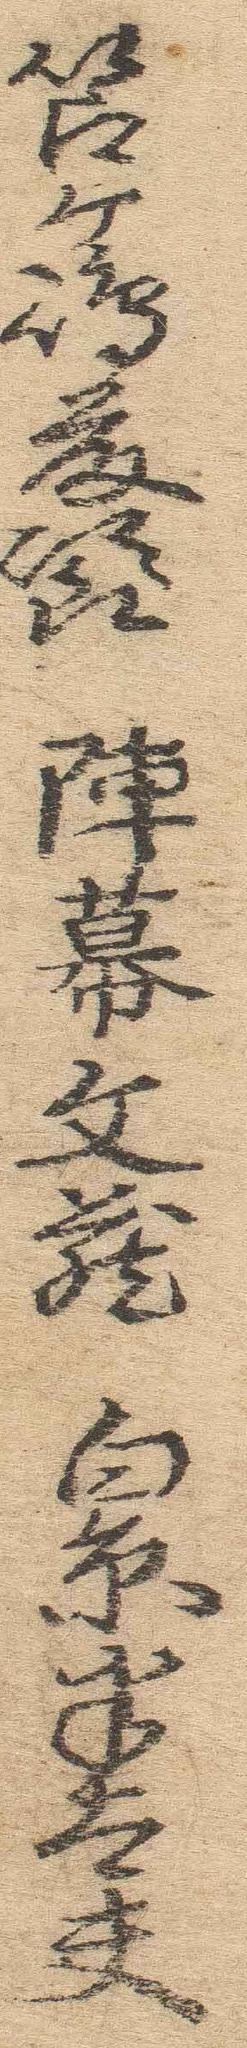節ケ嶋藤次郎陣幕文蔵白糸半太夫
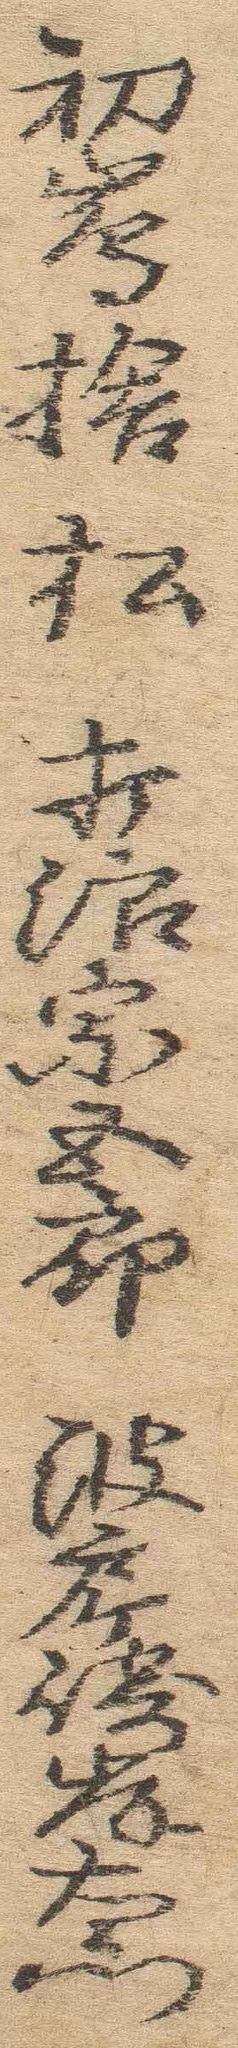初嶋捨松打浪宗五郎波戸ケ崎岸右衛門
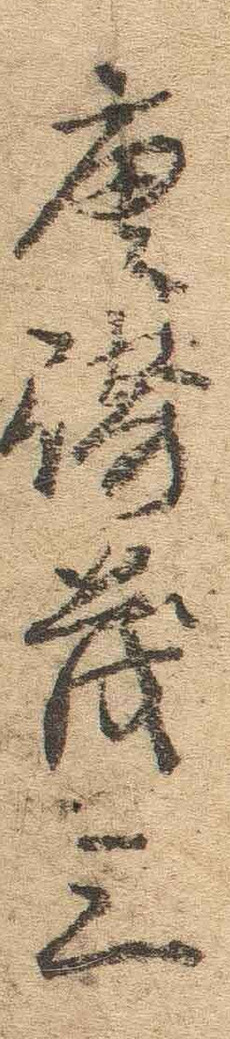唐崎茂三

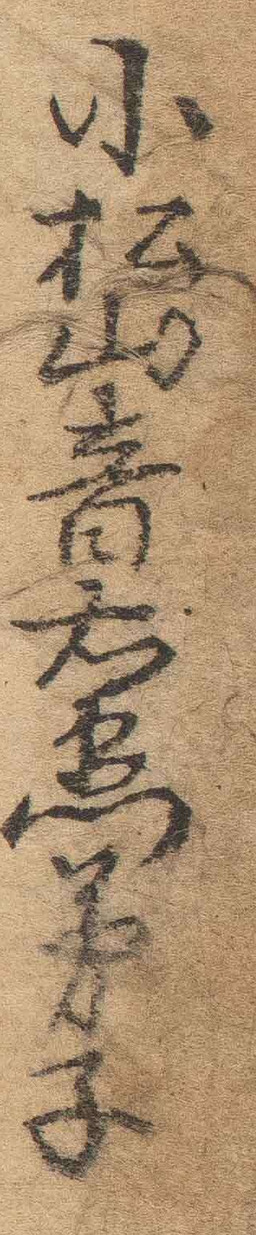京小松山音右衛門弟子
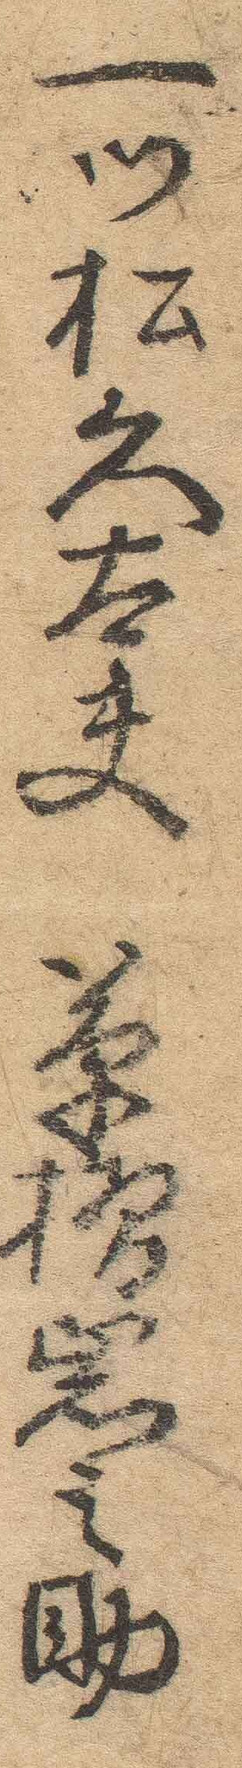一ツ松久太夫茶摺岩之助
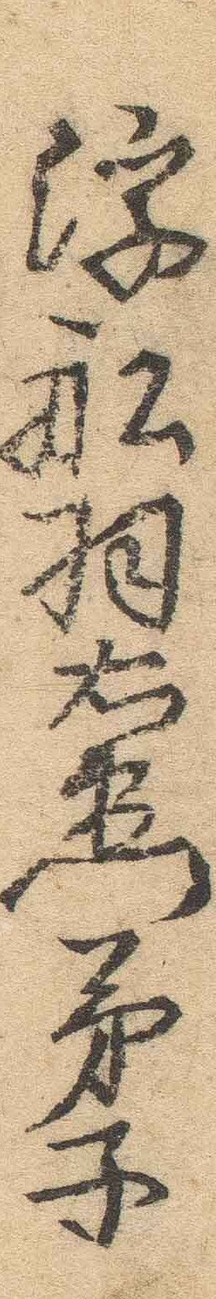京浮船羽右衛門弟子
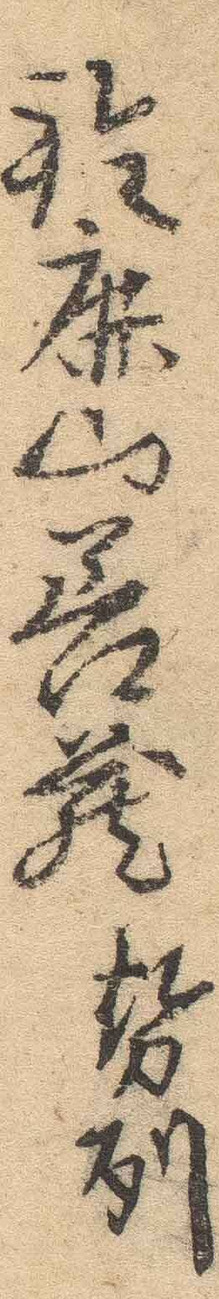於鹿山善蔵勢州
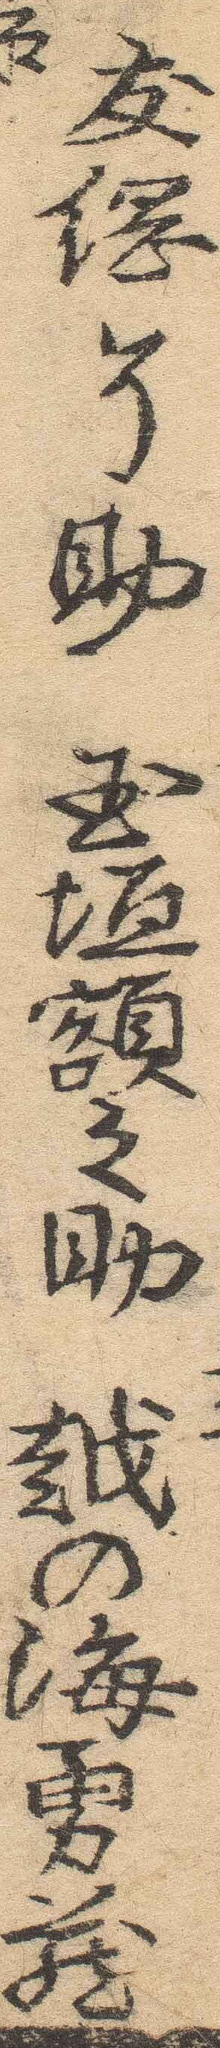友綱了助玉垣額之助越の海勇蔵
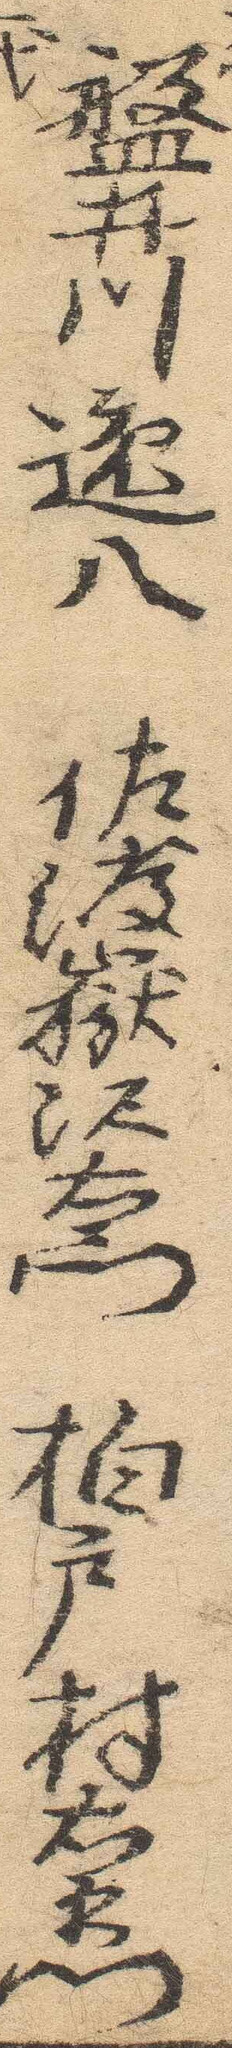盤井川逸八佐渡嶽沢右衛門柏戸村右衛門
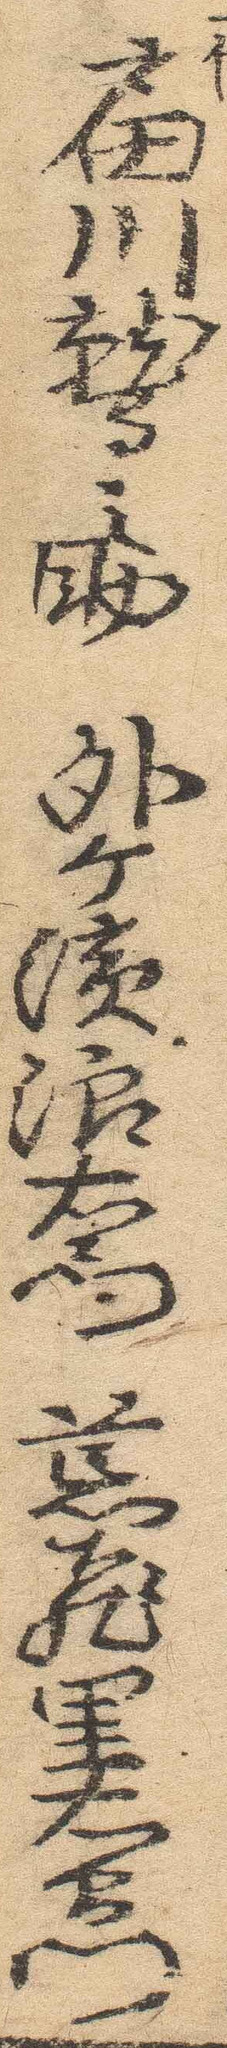戸田川鷲之助外ケ濱浪右衛門荒飛里右衛門
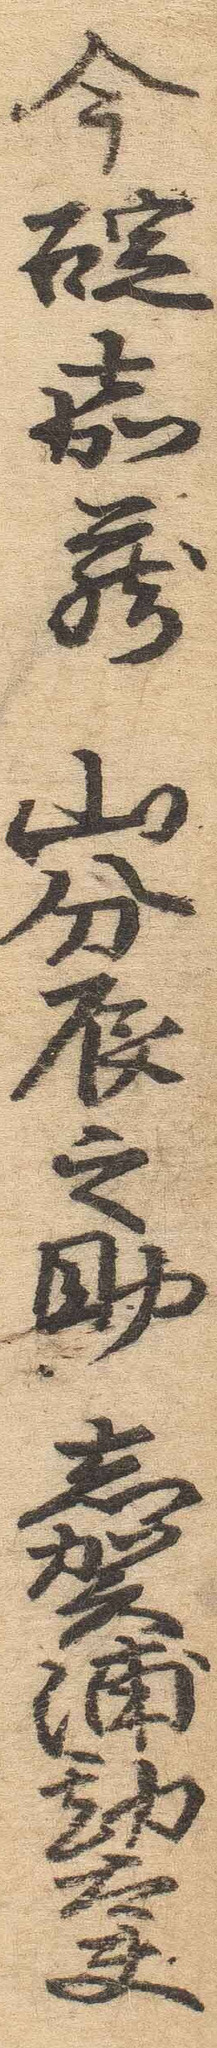今碇嘉蔵山分辰之助志賀浦勘太夫
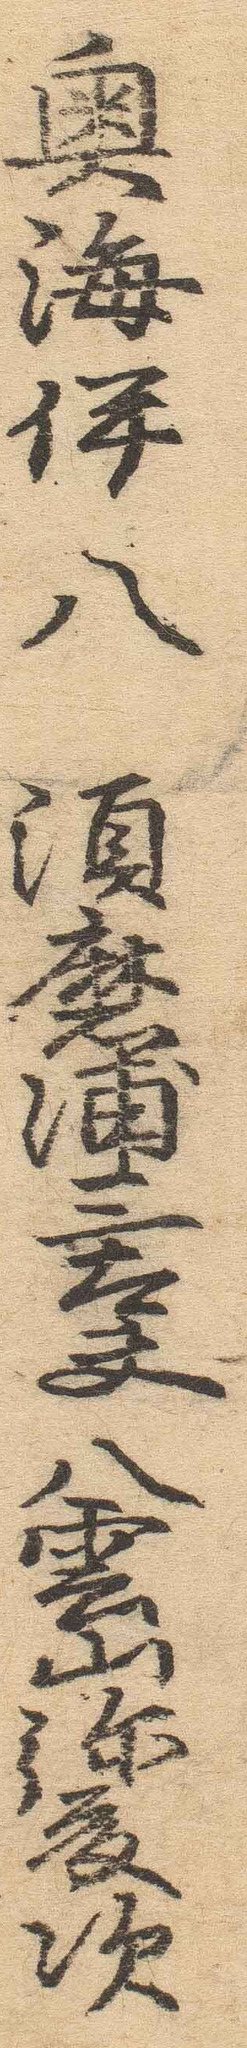奥海伊八須磨浦三太夫八雲山弥藤次
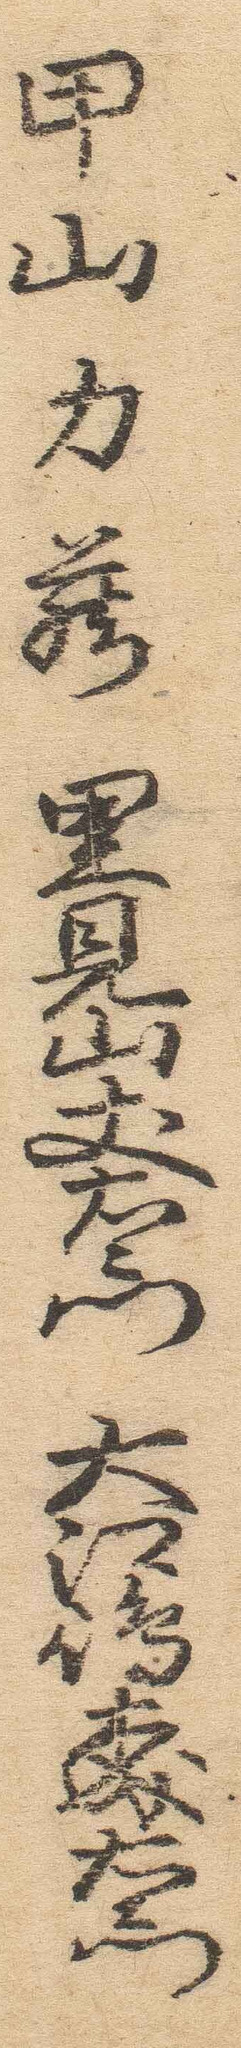甲山力蔵里見山丈右衛門大江嶋森右衛門
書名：古今相撲大全
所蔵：東京学芸大学附属図書館 国文学研究資料館
